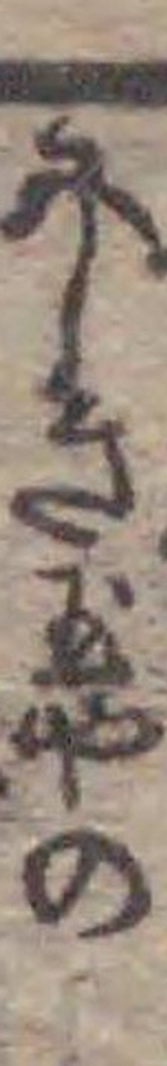五しき玉やの
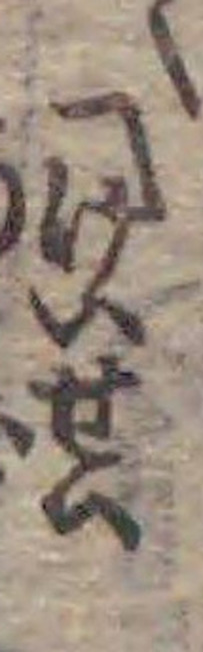〽けいせい
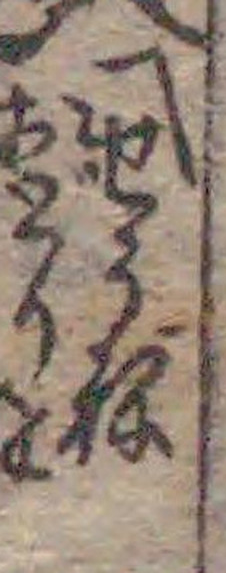〽せうね
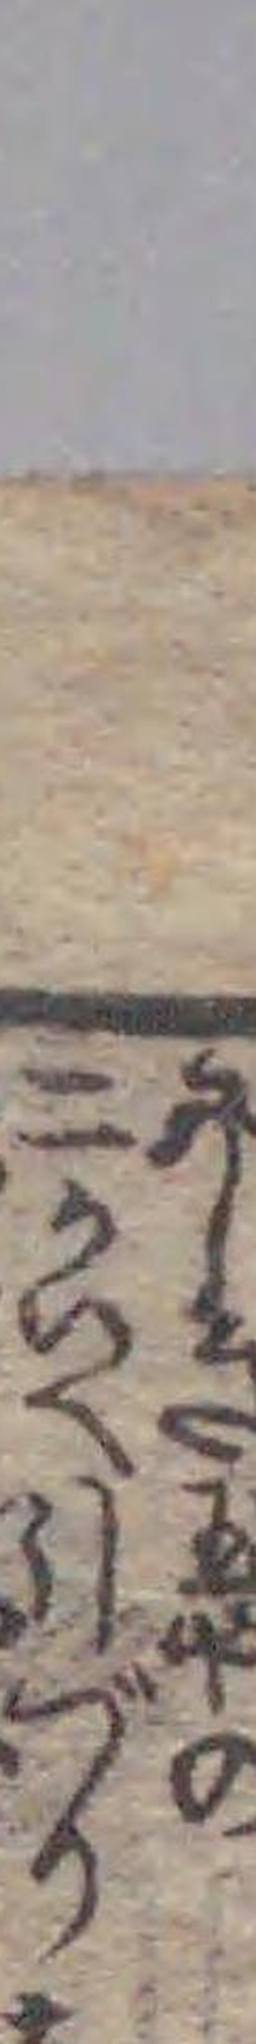二かいへ引づり
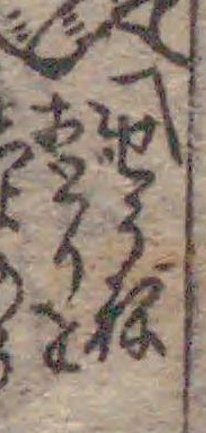〽せうね
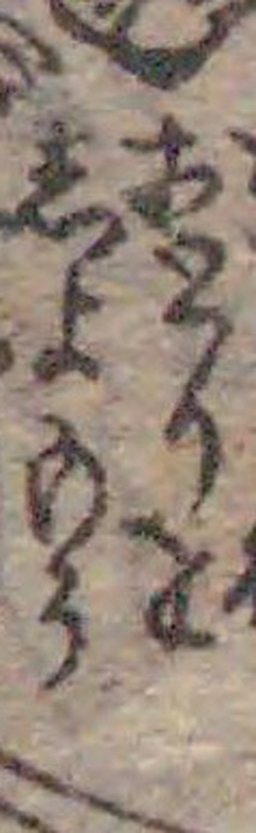しよもう
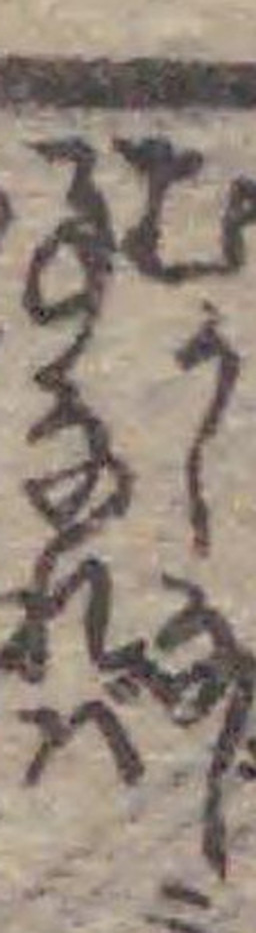事なれば
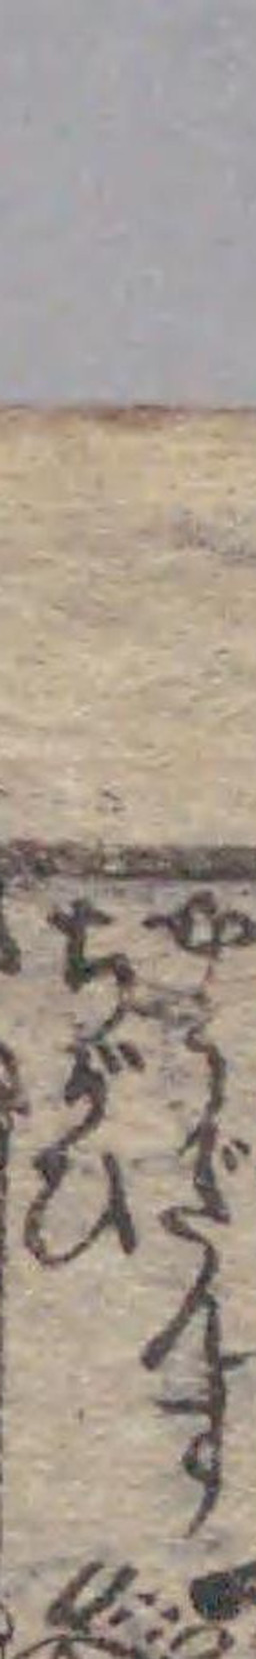ちがひ
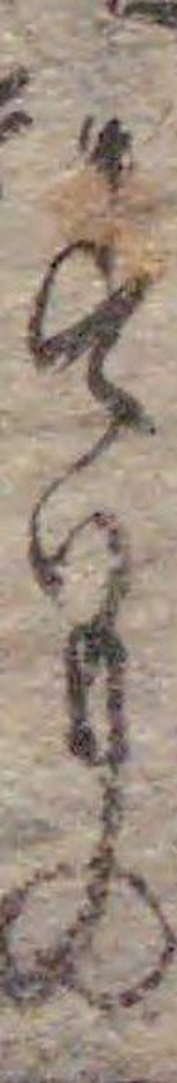すいもの
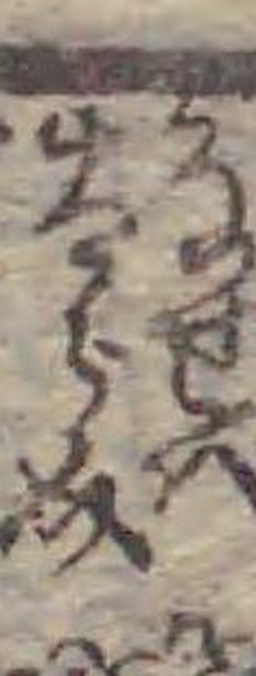太郎介
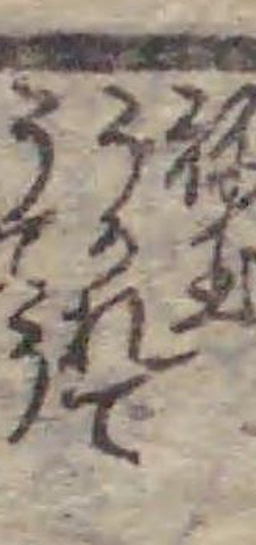うかれて
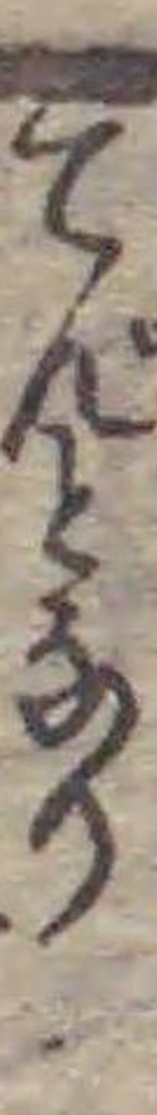てんとなり
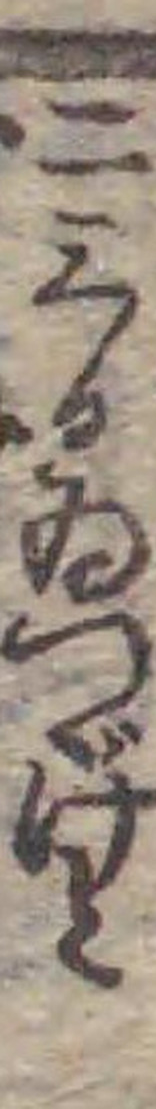二三日ゐつゞけと
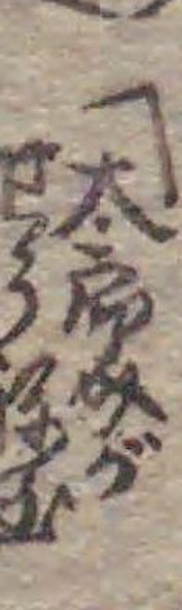〽太郎介が
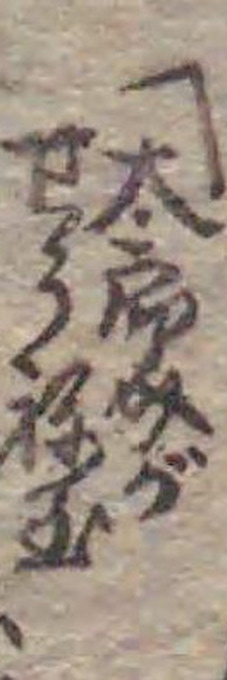せうね玉
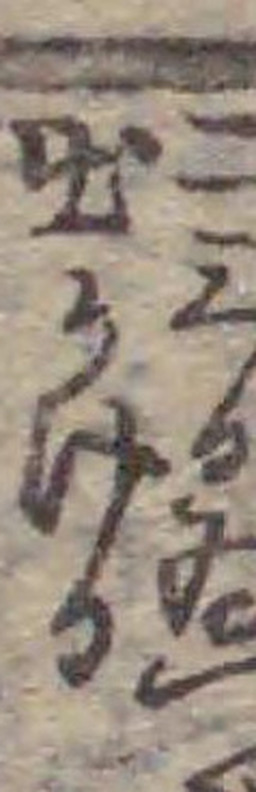出かける
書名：四遍搨心学草帋 : 3巻
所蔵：国立国会図書館 National Diet Library, JAPAN
